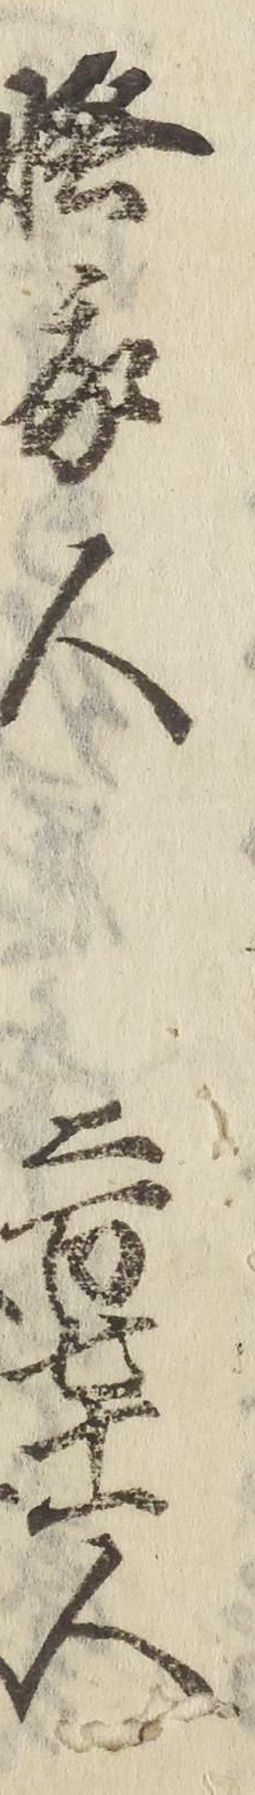怪我人二百七十一人
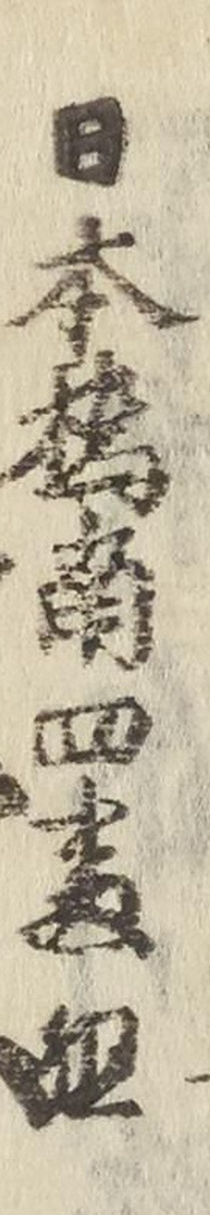日本橋南四番組
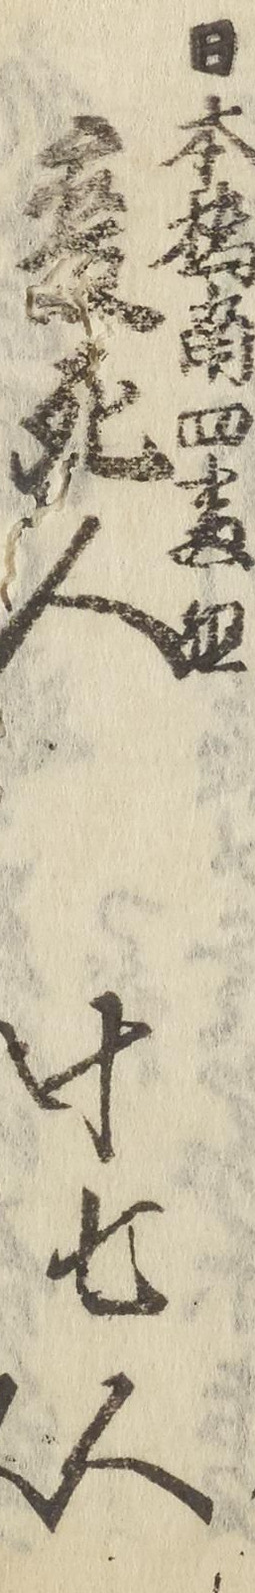変死人十七人
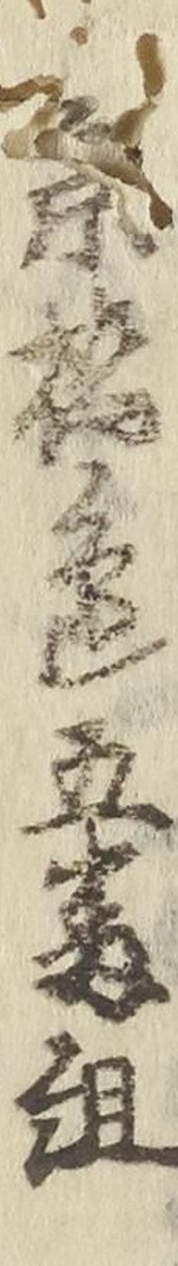京橋辺五番組
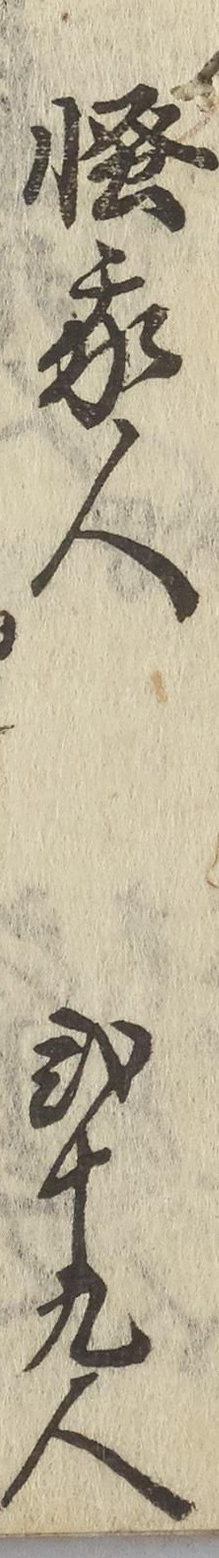怪我人弐拾四人
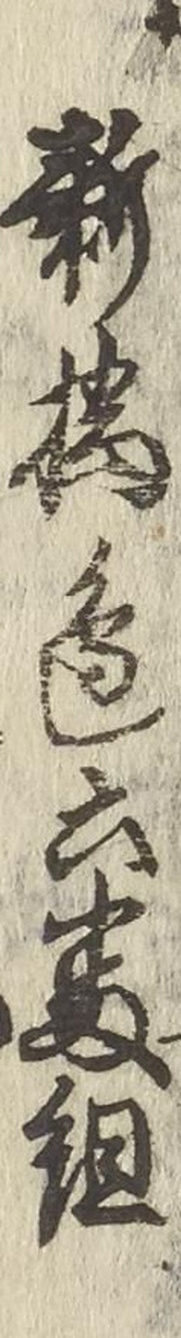京橋辺五番組

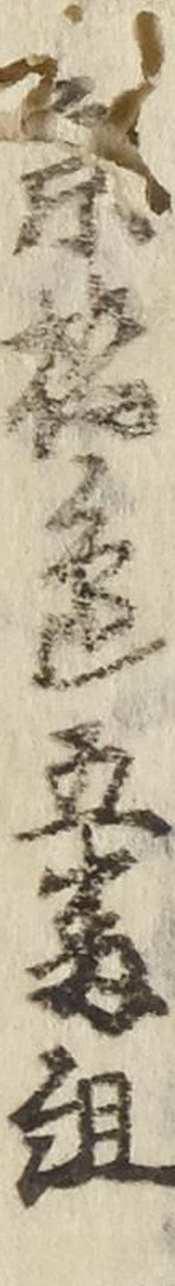新橋辺六番組
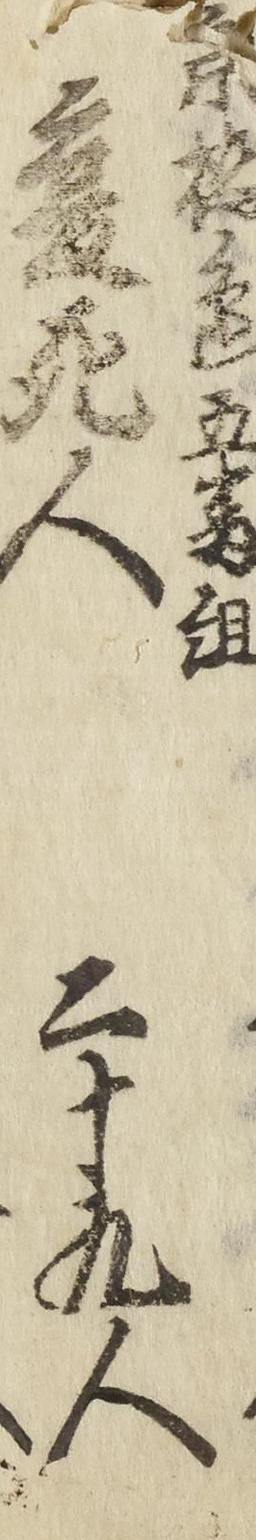変死人六十五人
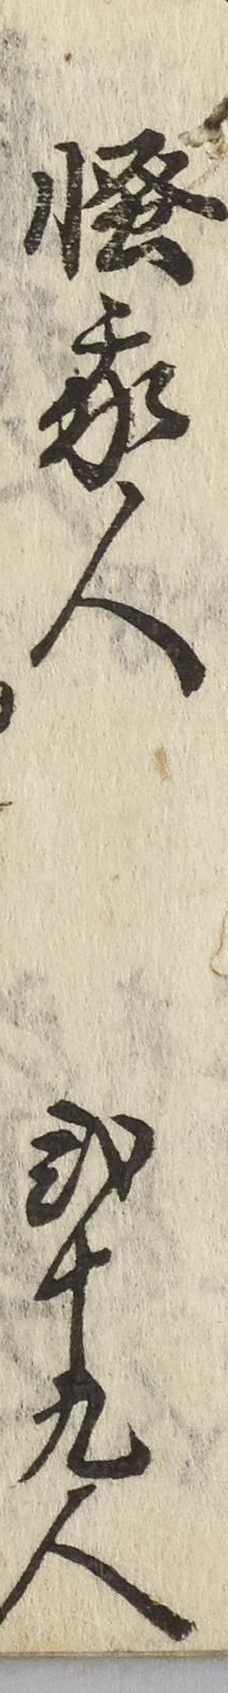怪我人弐十九人
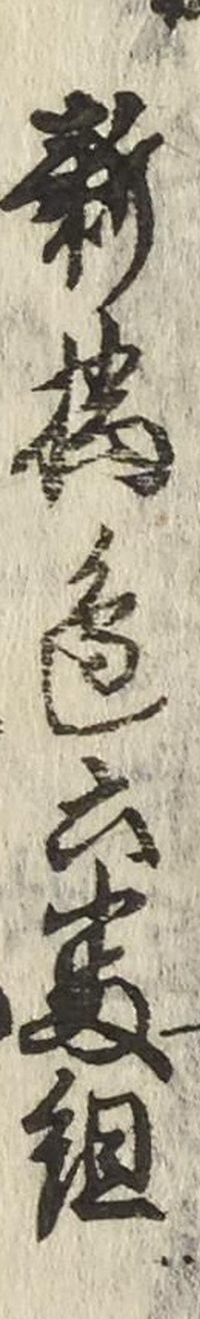新橋辺六番組
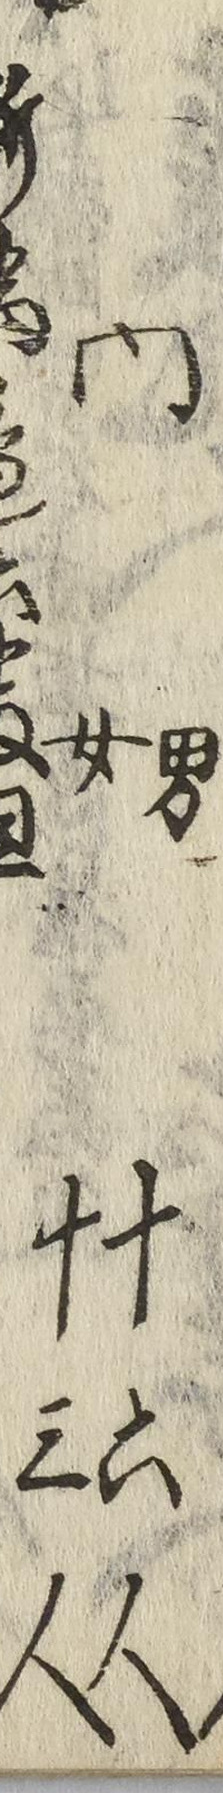内男十六人
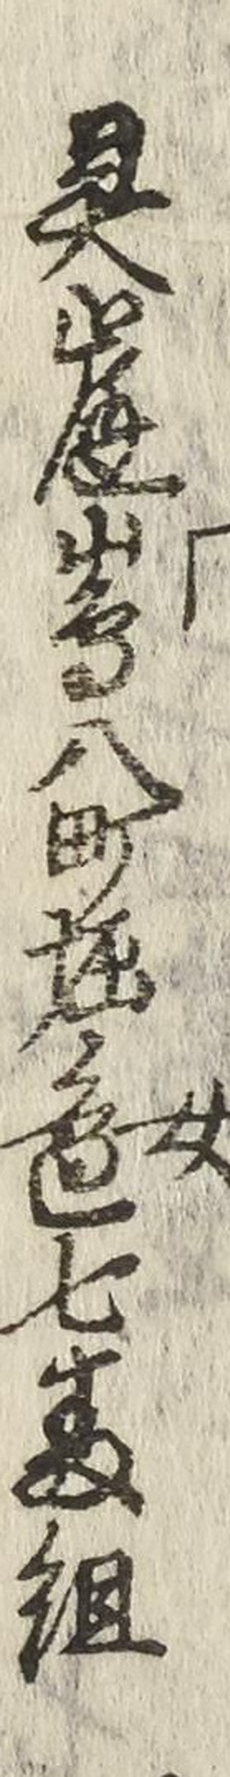霊岸島八町堀辺七番組
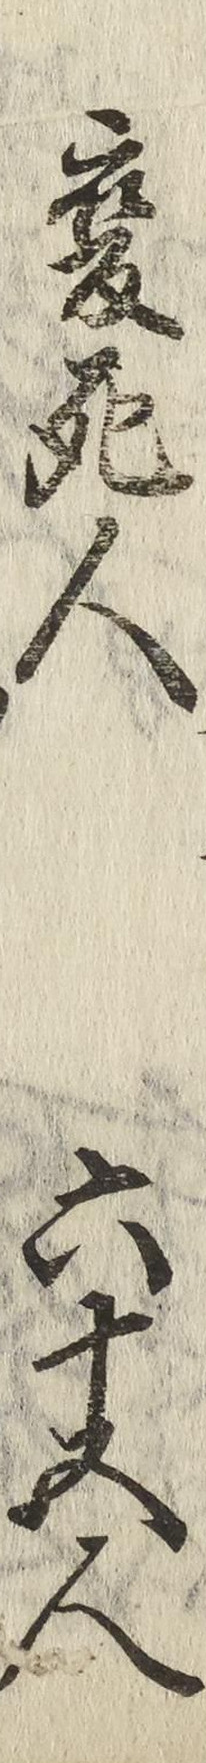変死人六十五人
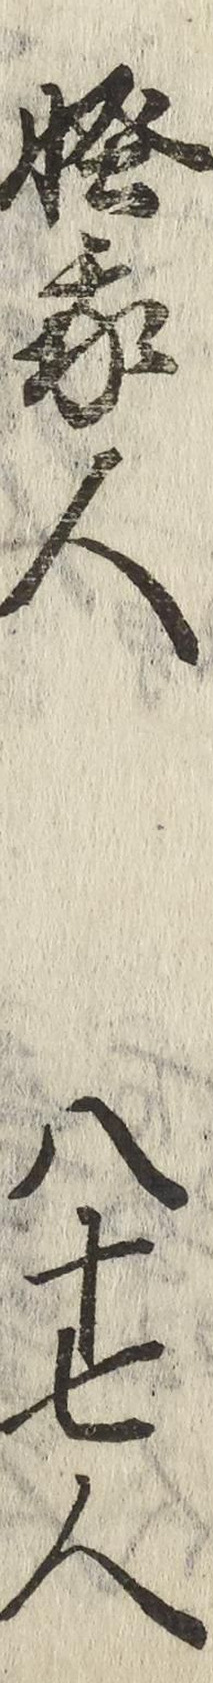怪我人八十七人
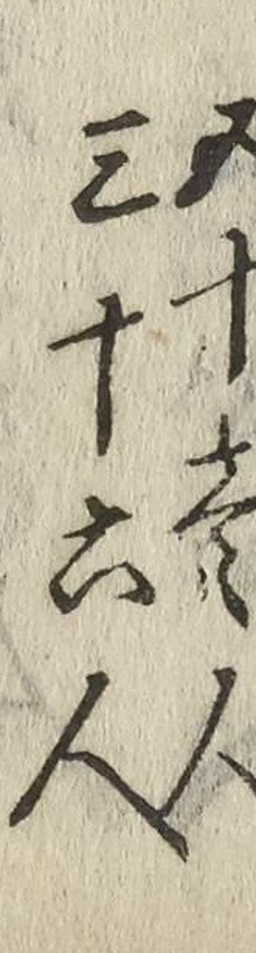女三十六人
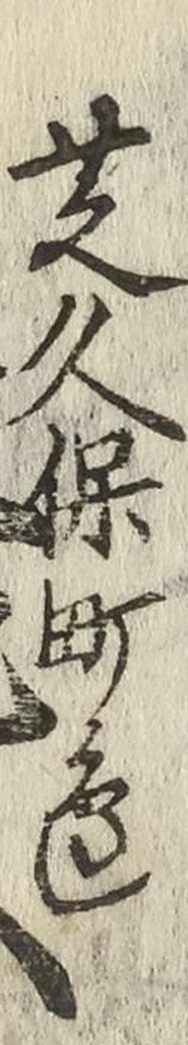芝久保町辺
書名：地震出火　男女死人怪我人書上之寫
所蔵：東京大学地震研究所図書室 Earthquake Research Institute Library, The University of Tokyo, JAPAN
